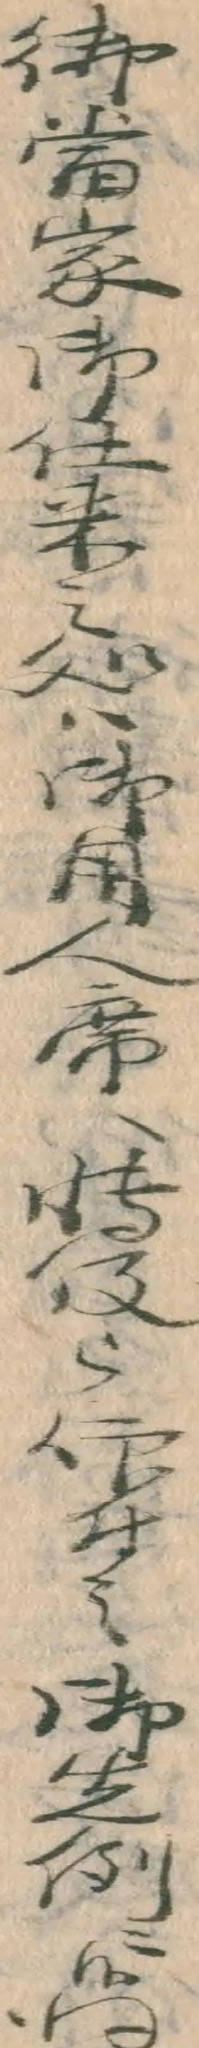御當家御仕来之処ハ御用人席へ轉役被仰付之御先例ニ候得
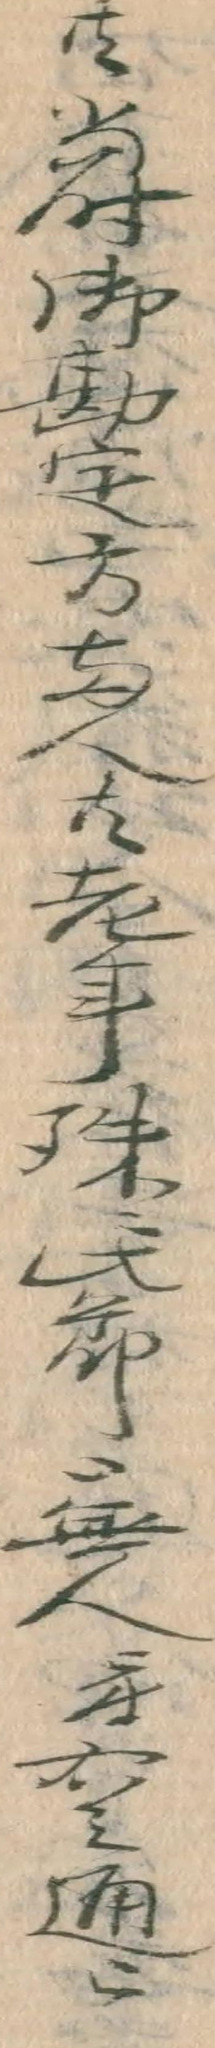共當時御勘定方両人共老年殊ニ此節御無人ニ付右之通被
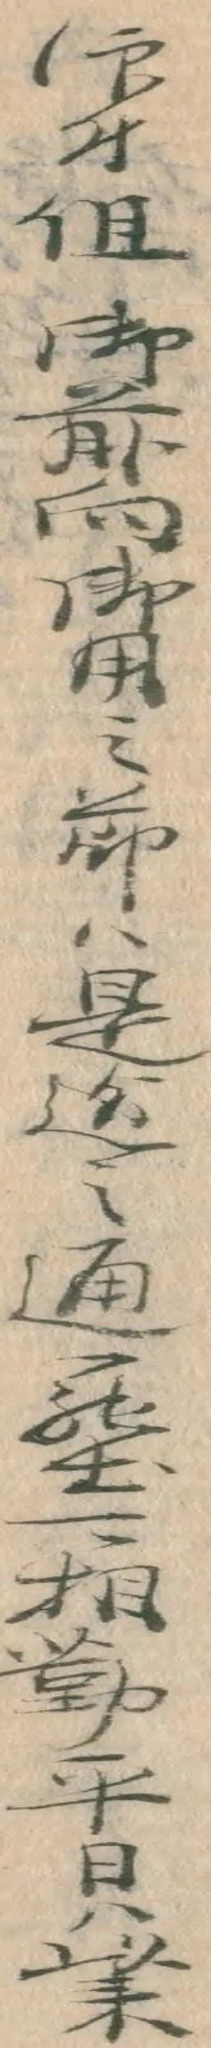仰付伹御前向御用之節ハ是迄之通罷出可相勤平日ハ以来
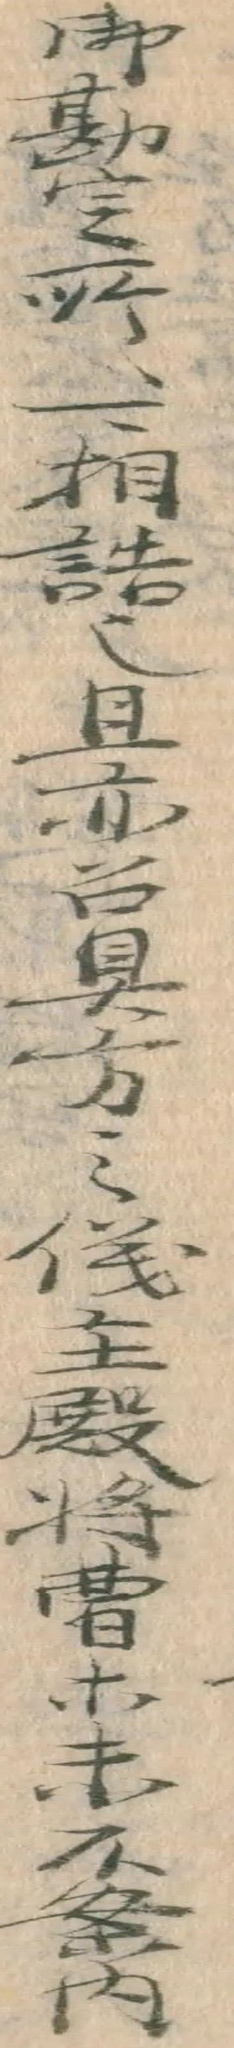御勘定所へ可相詰也且亦召具方之儀主殿将曹等未不案内
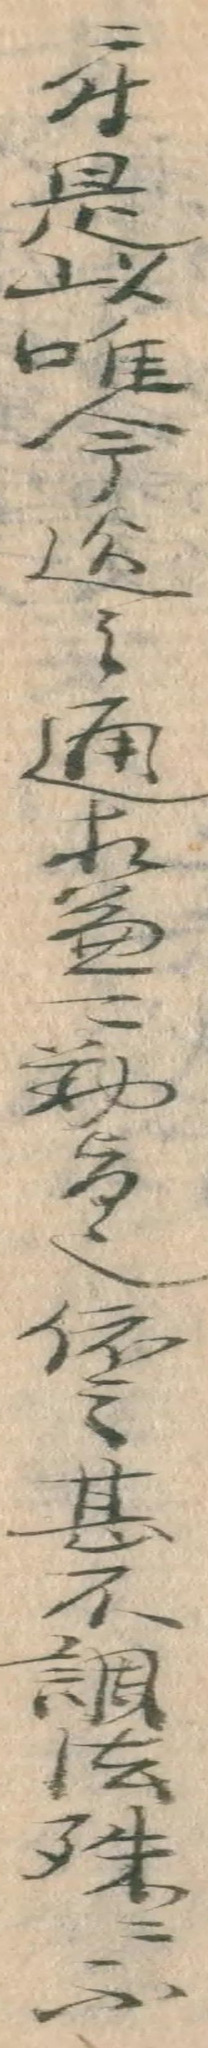ニ付是以唯今迄之通相兼可勤旨也依之甚不調法殊ニ不
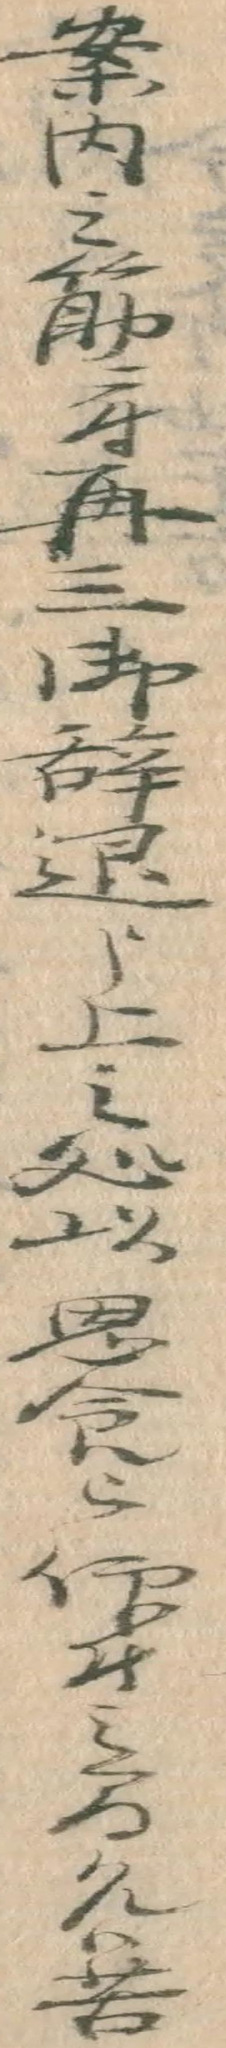案内之筋ニ付再三御辞退申上之処以思食被仰付之間乍御苦
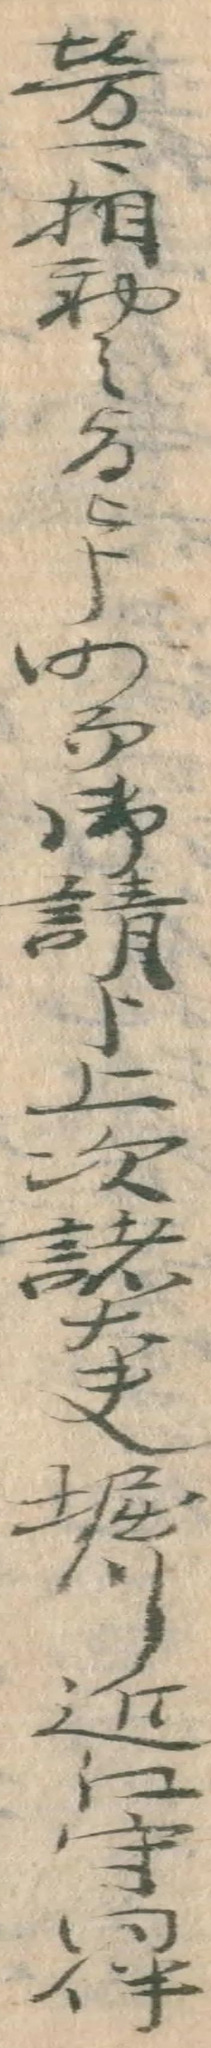労可相勤之旨被申仍而御請申上次諸大夫堀川近江守同伴
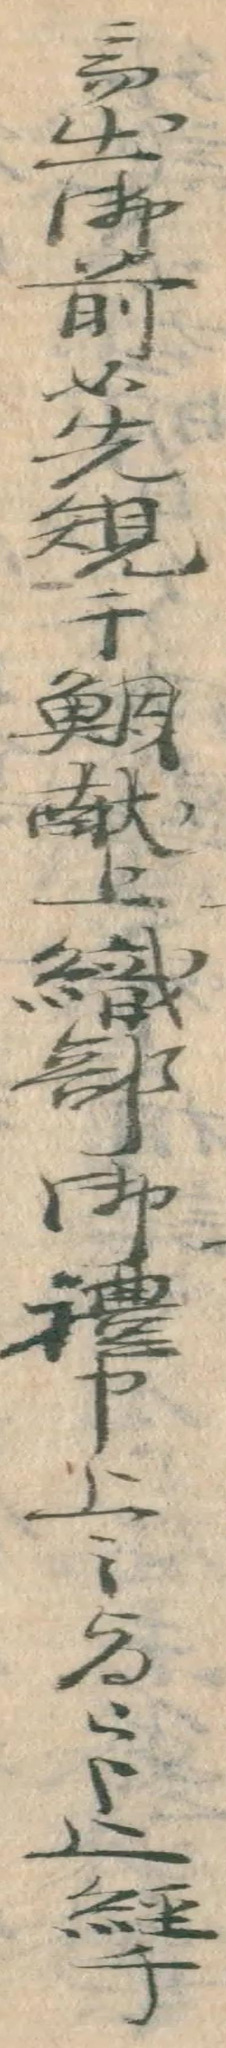ニ而出御前如先規干鯛献上織部御禮申上之旨被申上經干
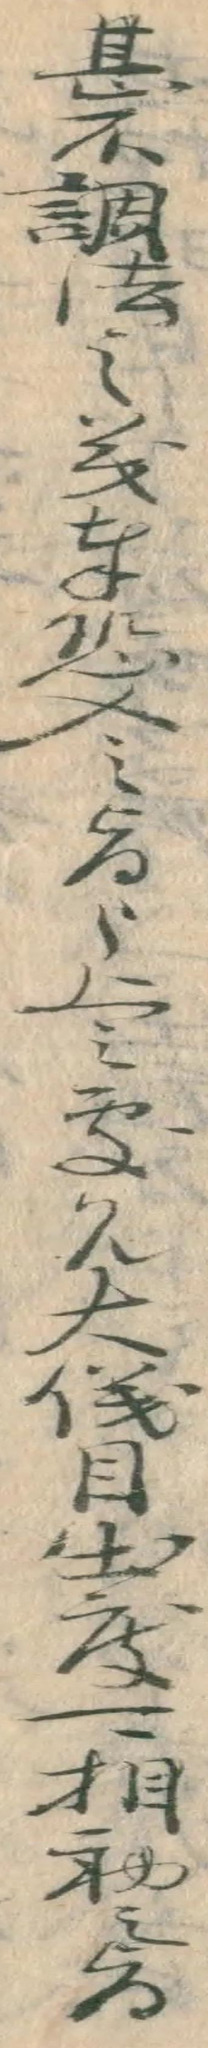甚不調法之義奉恐入之旨申上之處乍大儀目出度可相勤之旨
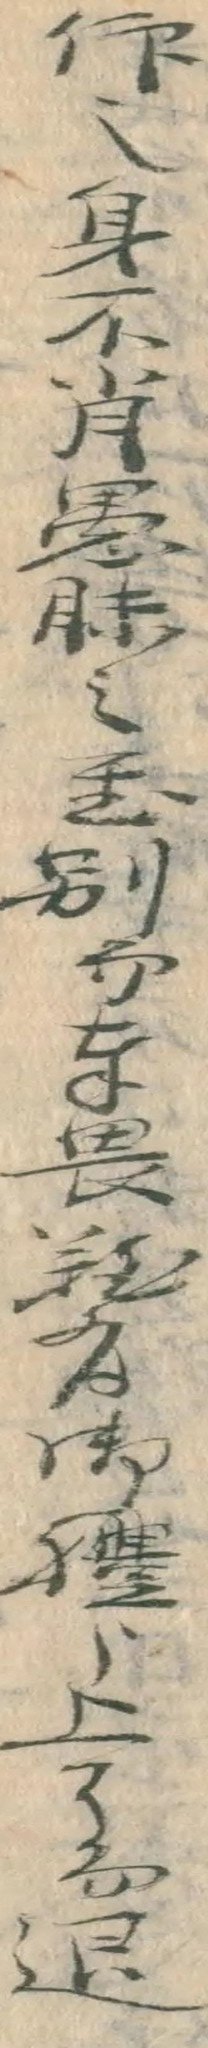仰之身不肖愚昧之迷別而奉畏難有御禮申上了而退
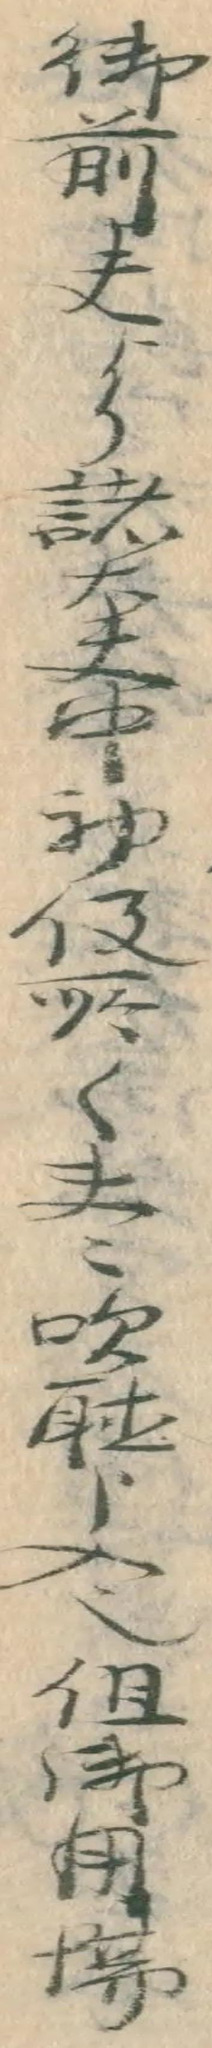御前夫より諸大夫中初役所〳〵夫〻吹聴申入也但御用場

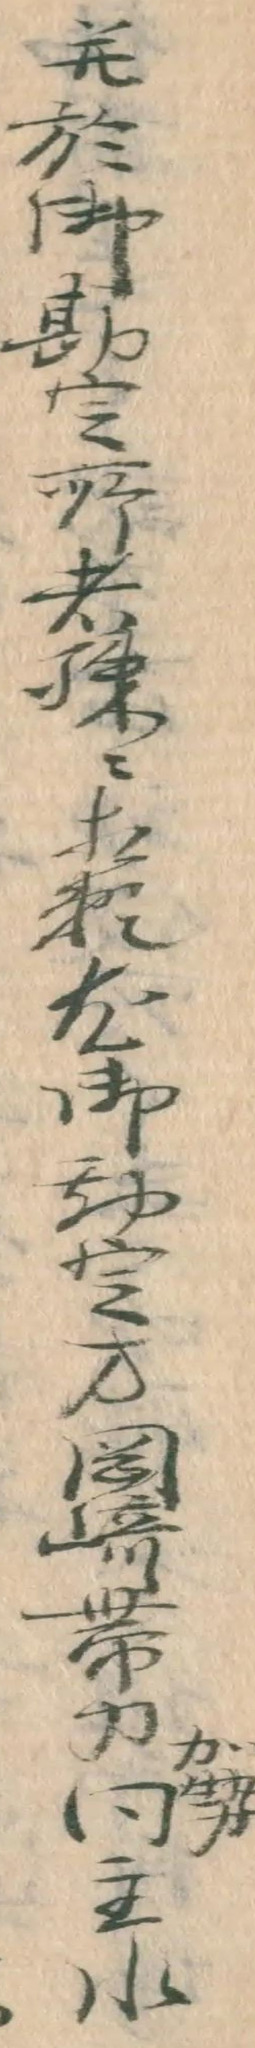幷於御勤定所者殊ニ相頼尤御勘定方岡崎帯刀加勢同主水
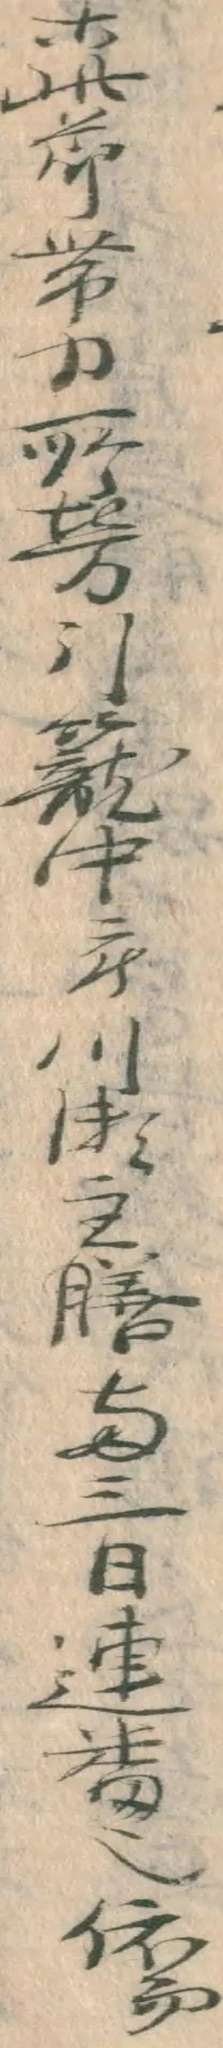等此節帯刀所労引籠中ニ付川瀬主膳両三日連番也依而
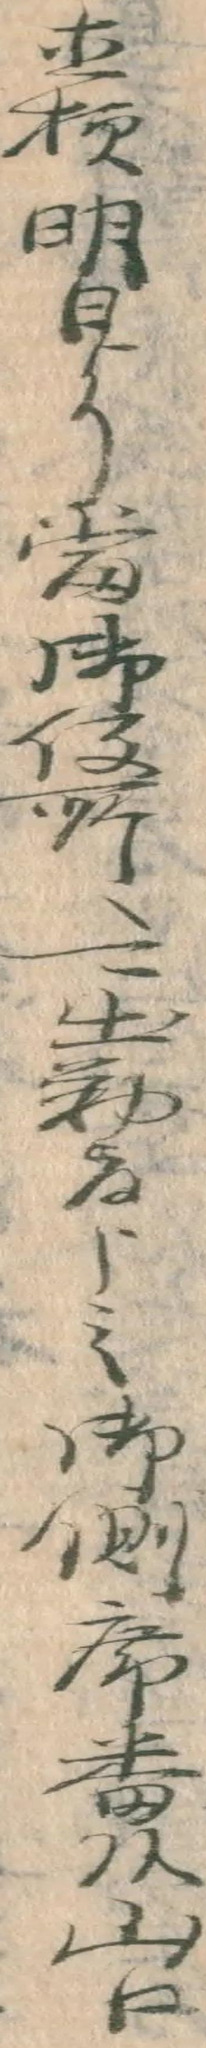直様明日より當御役所へ可出勤旨申之御側席番頭山口
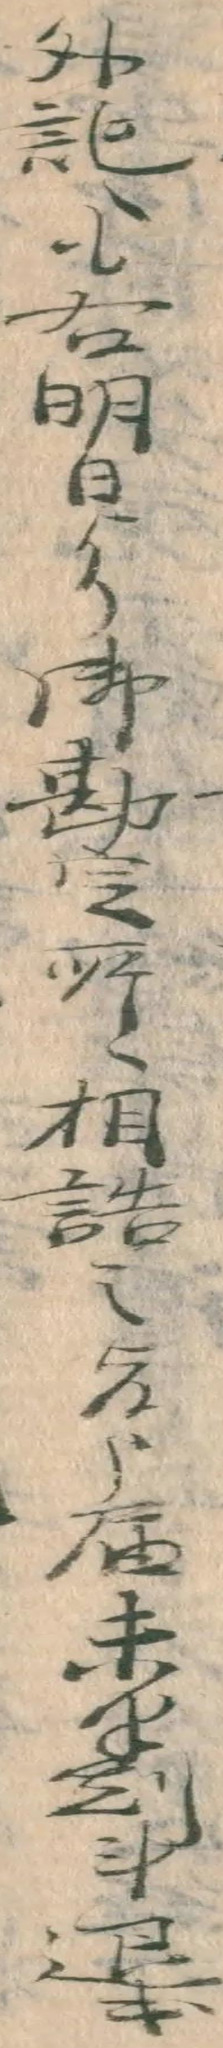外記へも右明日より御勘定所へ相詰之旨申届未半刻計退キ
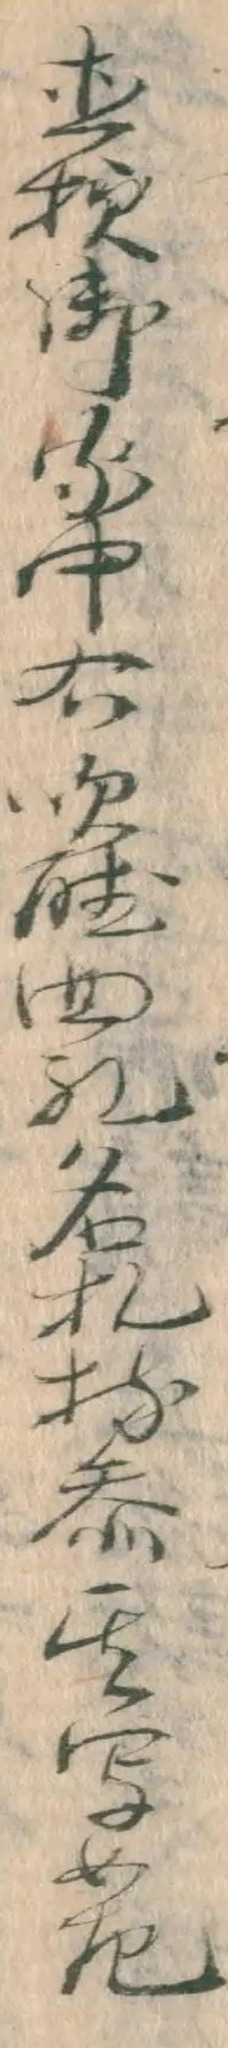直様御家中右吹聴回礼名札持参其写如左
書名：賀茂社記録. 第65冊
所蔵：国立国会図書館 National Diet Library, JAPAN
